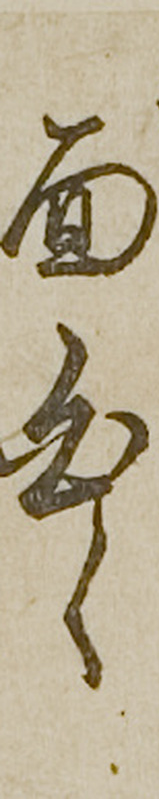面白く
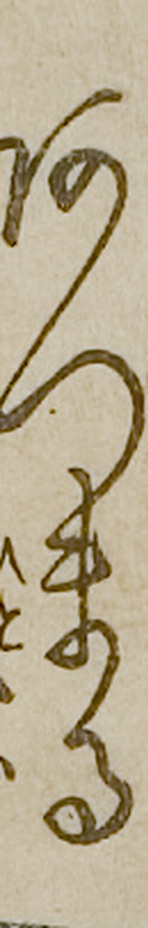あつまる
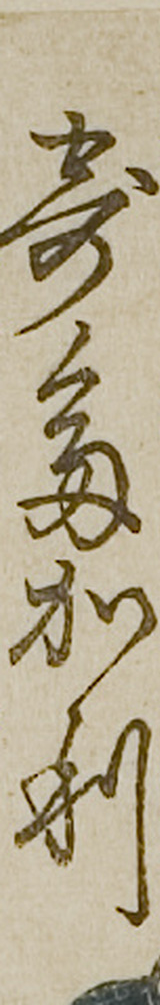寄多か利
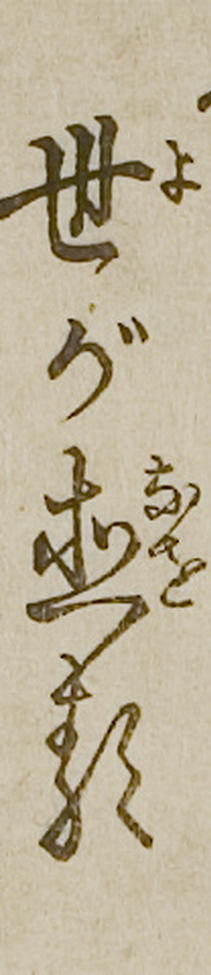世が直る
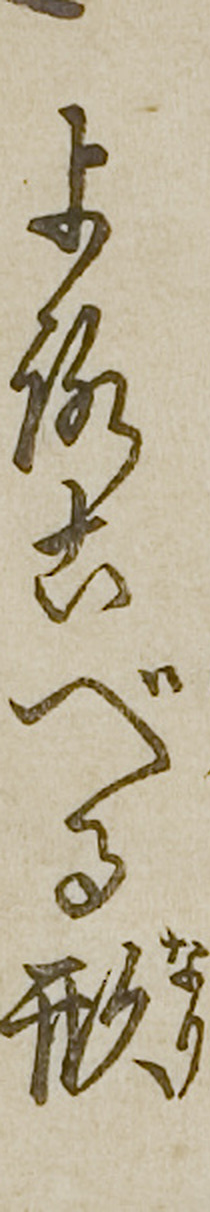よろこべる形
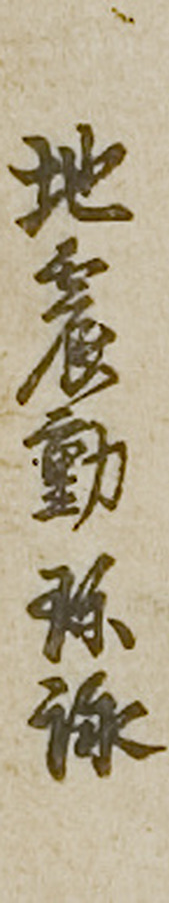地震動珍録
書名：[面白くあつまる人が寄たかり]
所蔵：東京大学総合図書館 General Library in the University of Tokyo, JAPAN
